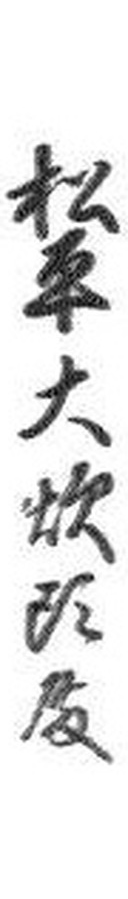松平大炊頭殿
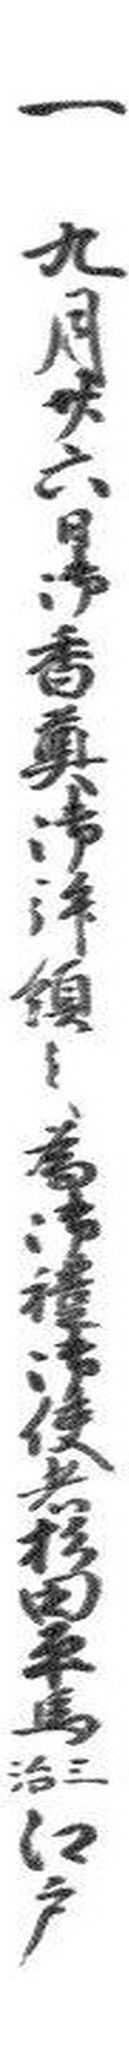一九月廿六日御香奠御拝領之為御礼御使者杉田平馬三治江戸
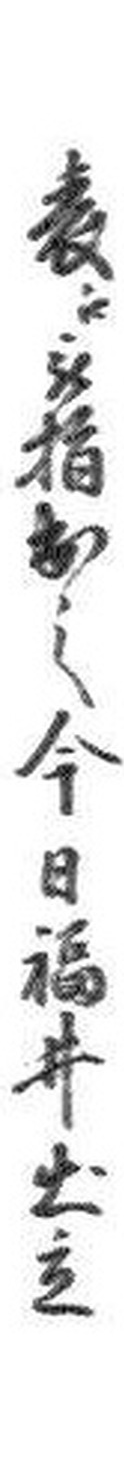表江被指出之今日福井出立
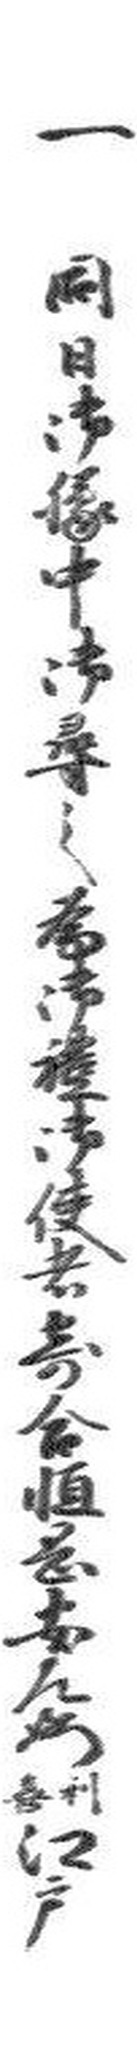一同日御朦中御尋之為御礼御使者寄合恒岡安左衛門利喜江戸
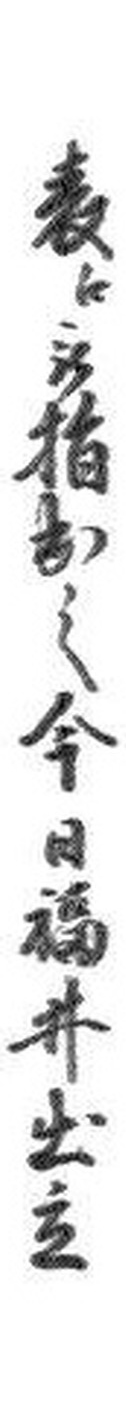表江被指出之今日福井出立
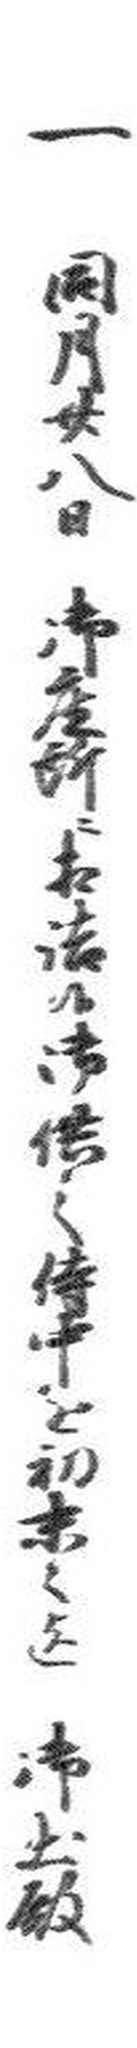一同月廿八日御座所ニ相詰候御供之侍中を初末々迄御出殿
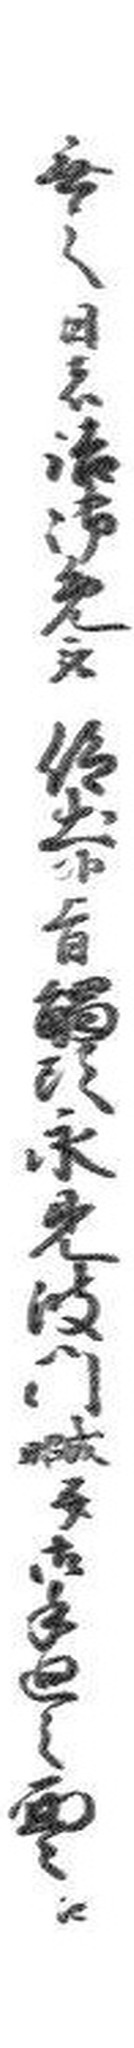無之日者詰御免被仰出候旨触頭永見波門成昭并御手廻之面々江

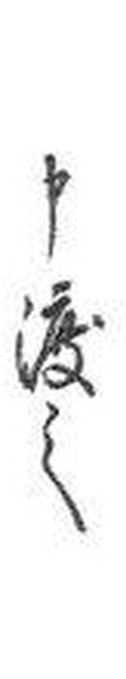申渡之
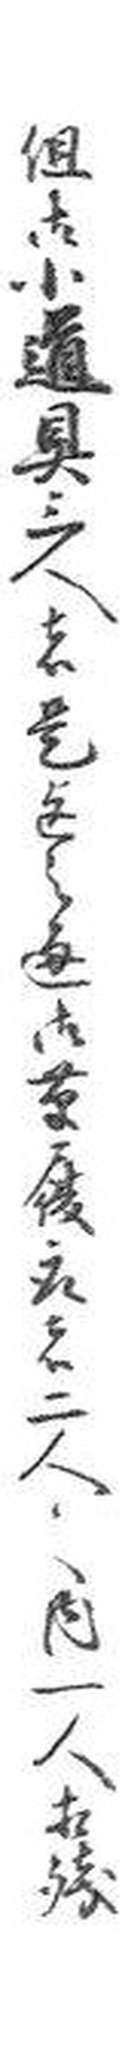但御小道具三人者是迄之通御草履取者二人之内一人相残
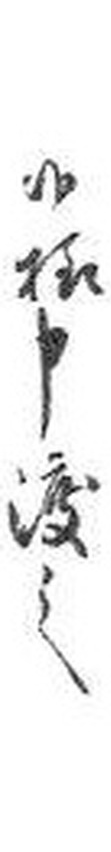候様申渡之
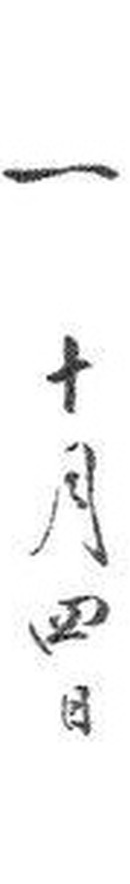一十月四日
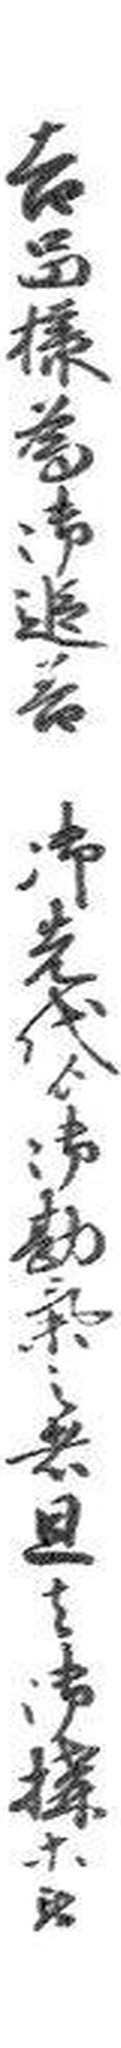吉品様為御追善御先代ゟ御勘気之者且者御構等被
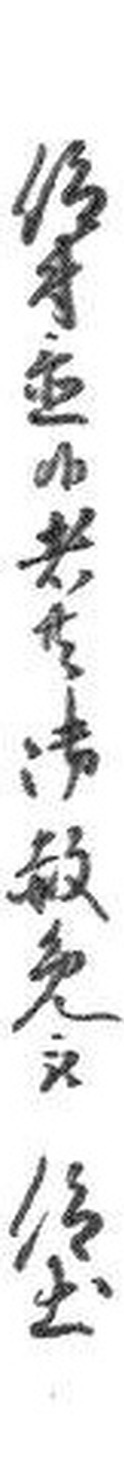仰付置候者共御赦免被仰出
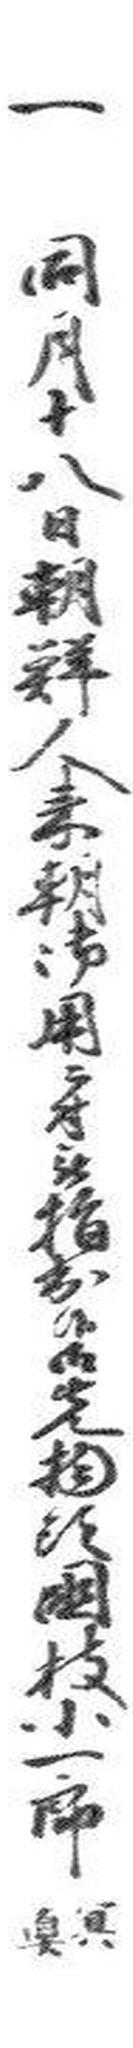一同月十八日朝鮮人来朝御用ニ付被指出候御先物頭国枝小一郎冥奥
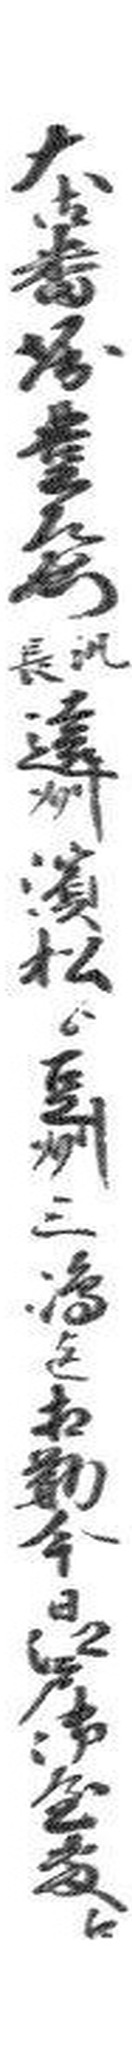大御番堀豊左衛門汎長遠州浜松ゟ豆州三島迄相勤今日江戸御屋敷江
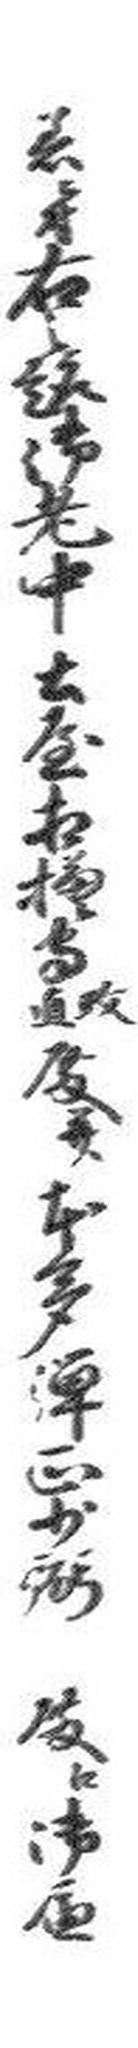着ニ付右之趣御老中土屋相模守政直殿并本多弾正少弼殿江御届
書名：家譜 二十八 吉邦公 従宝永七年七月五日到正徳元年十二月
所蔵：福井県文書館 Fukui Prefectural Archives
